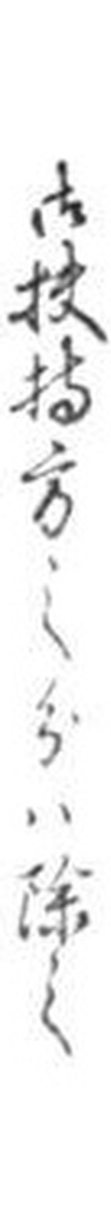御扶持方之分ハ除之
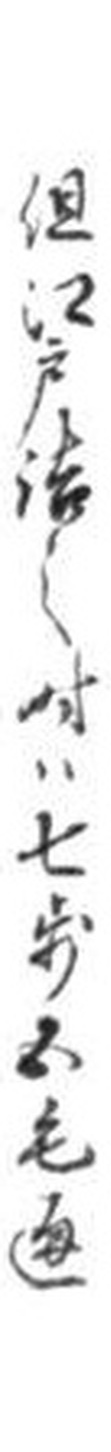但江戸詰之時ハ七歩五毛通
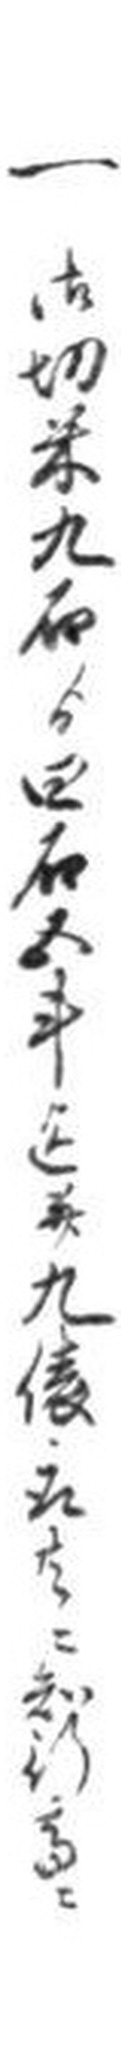一御切米九石ゟ四石五斗迄并九俵取共ニ知行高ニ
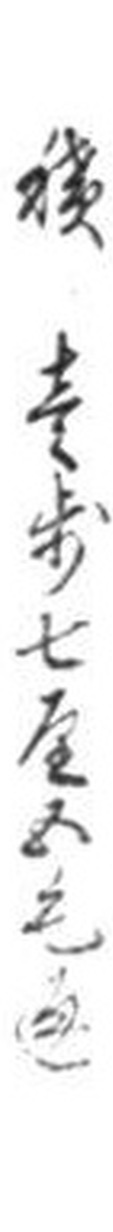積壱歩七厘五毛通
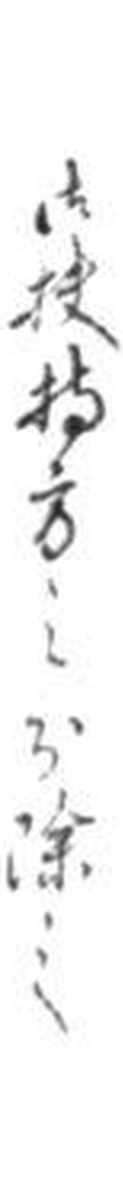御扶持方之分ハ除之
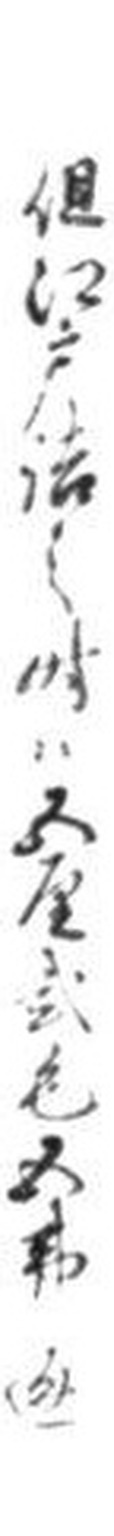但江戸詰之時ハ五厘弐毛五弗通
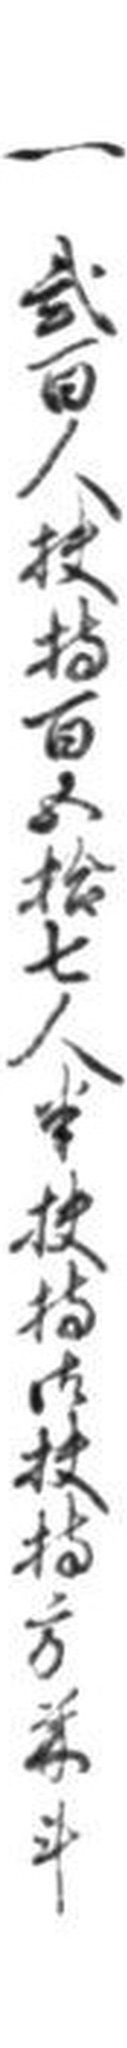一弐百人扶持百五拾七人半扶持御扶持方米斗
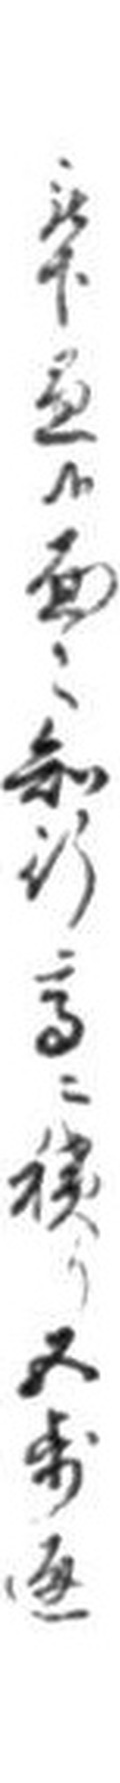被下置候面々知行高ニ積り五歩通
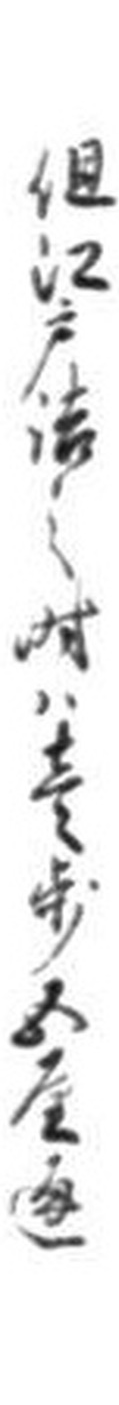但江戸詰之時ハ壱歩五厘通
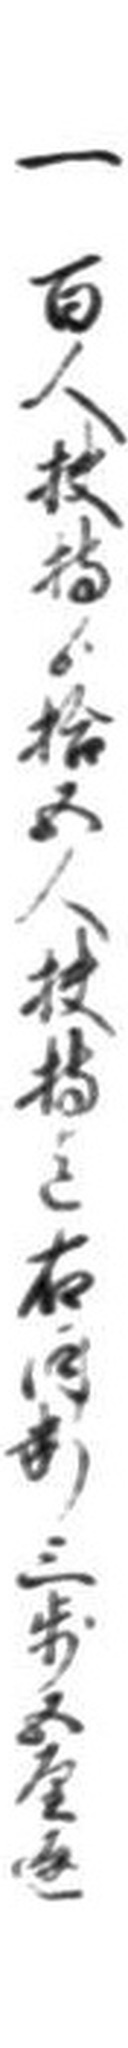一百人扶持ゟ拾五人扶持迄右同断三歩五厘通
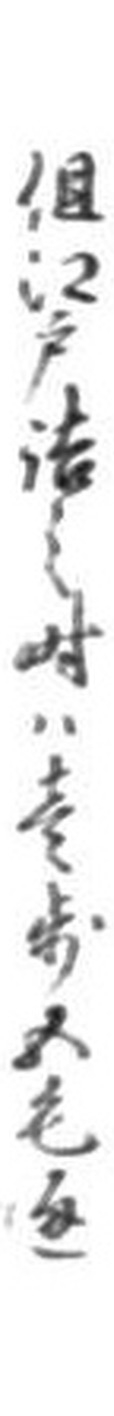但江戸詰之時ハ壱歩五毛通
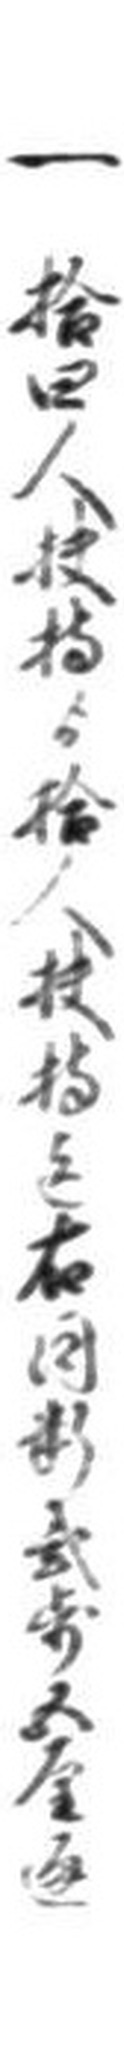一拾四人扶持ゟ拾人扶持迄右同断弐歩五厘通
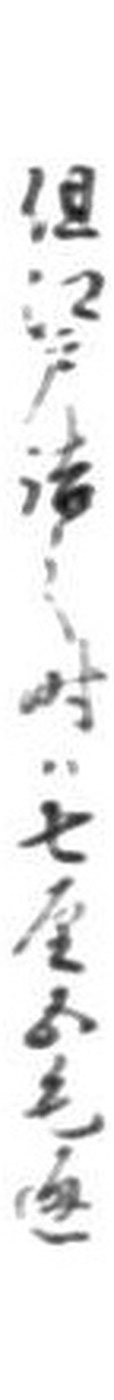但江戸詰之時ハ七厘五毛通
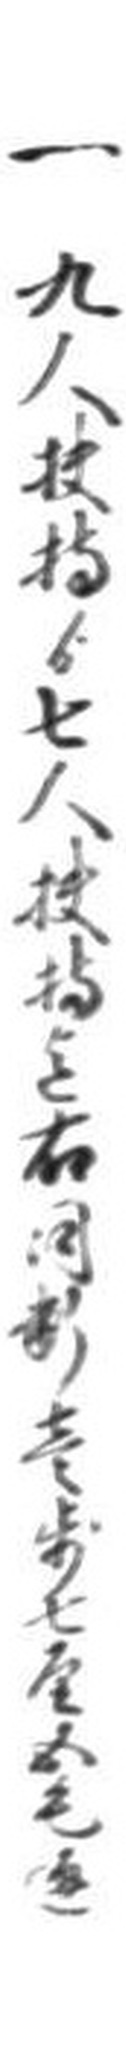一九人扶持ゟ七人扶持迄右同断壱歩七厘五毛通
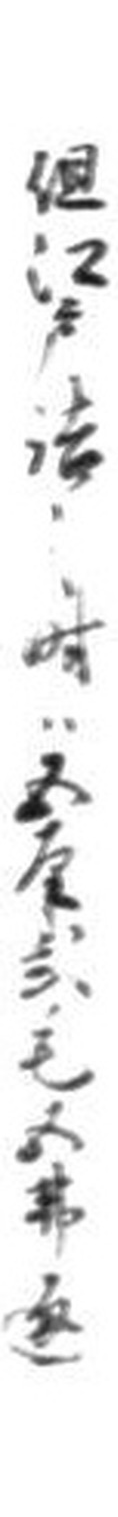但江戸詰之時ハ五厘弐毛五弗通
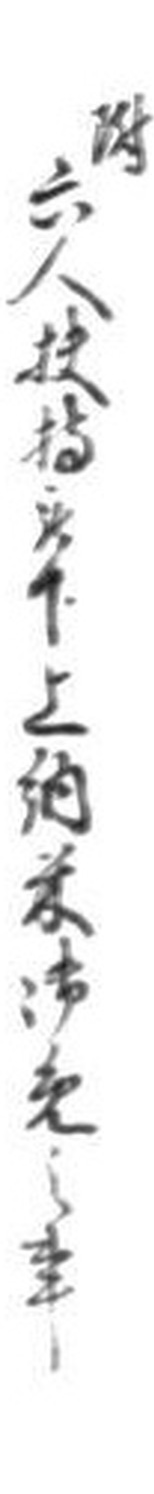六人扶持被下上納米御免之事
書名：家譜 三十八 宗矩公 従享保九年五月到享保九年十二月
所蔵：福井県文書館 Fukui Prefectural Archives
